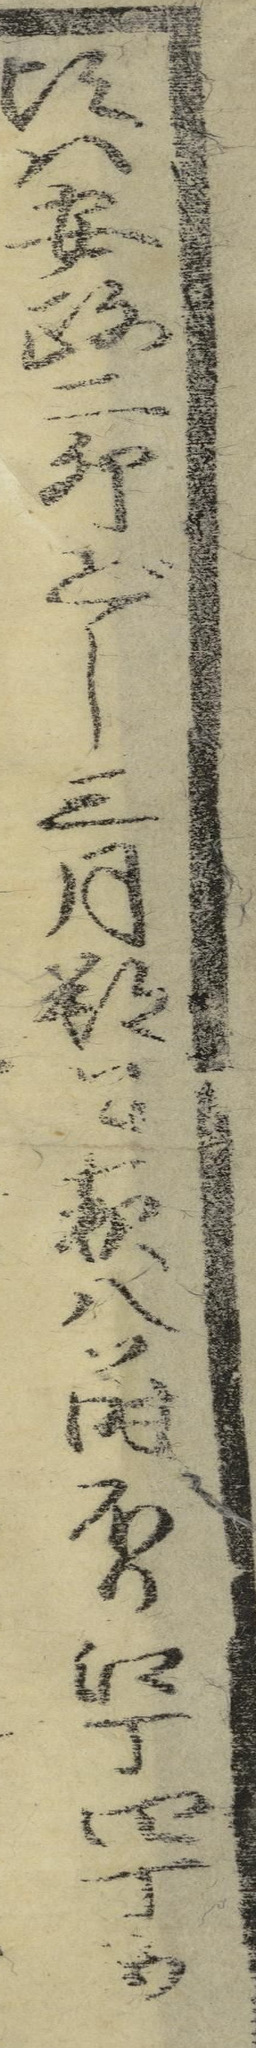頃は安政ニ卯どし三月朔日？夜八ツ時ほり江丁四丁め
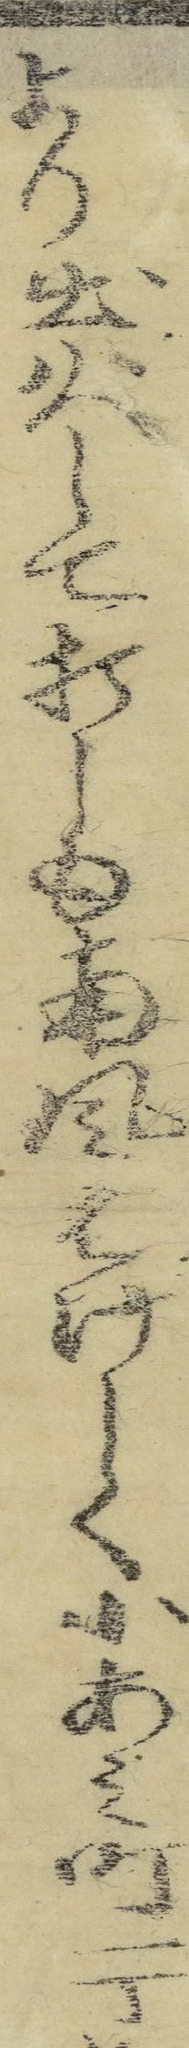より出火して折しも南風はけしく小あみ町一丁め
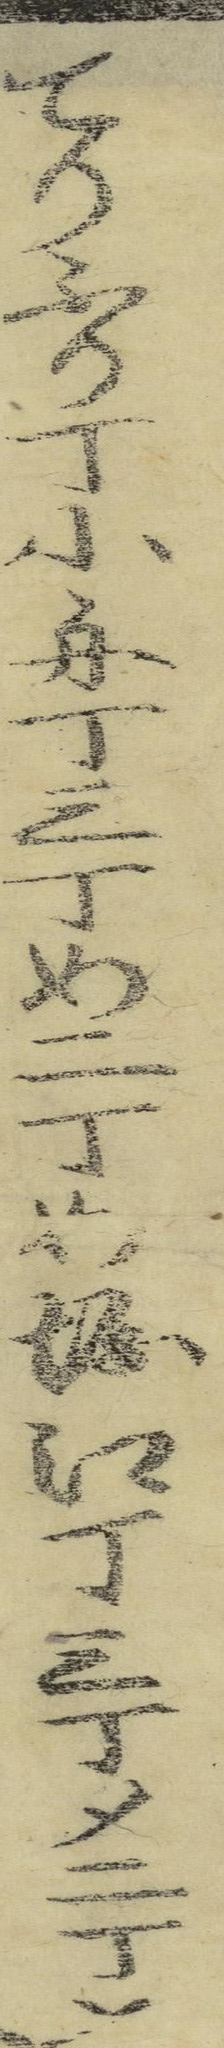てりふり丁小舟丁三丁め二丁め堀江丁三丁メ二丁メ
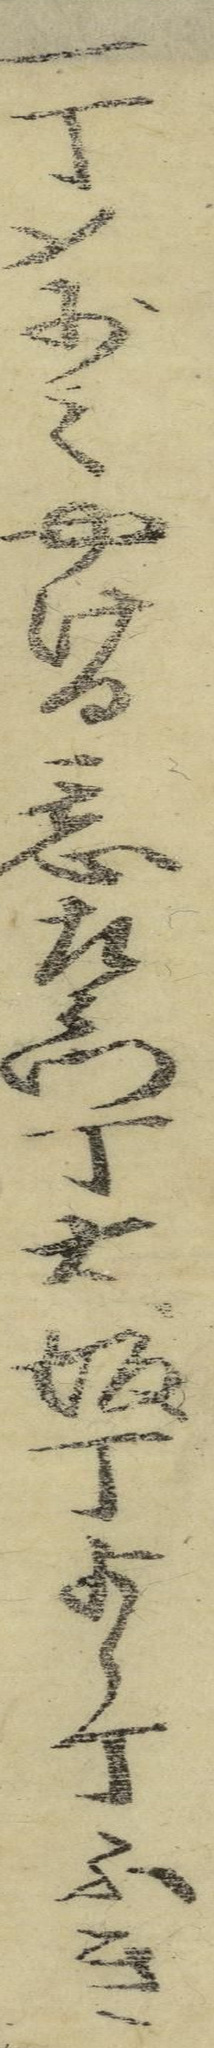一丁メ少〻やける甚左衛門丁大坂丁よし丁ふき
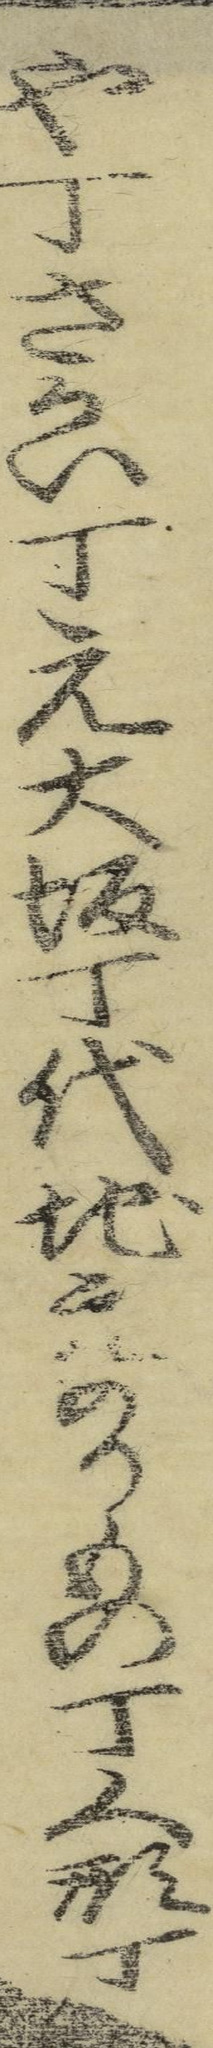や丁さかい丁元大阪丁代地元のりもの丁人形丁
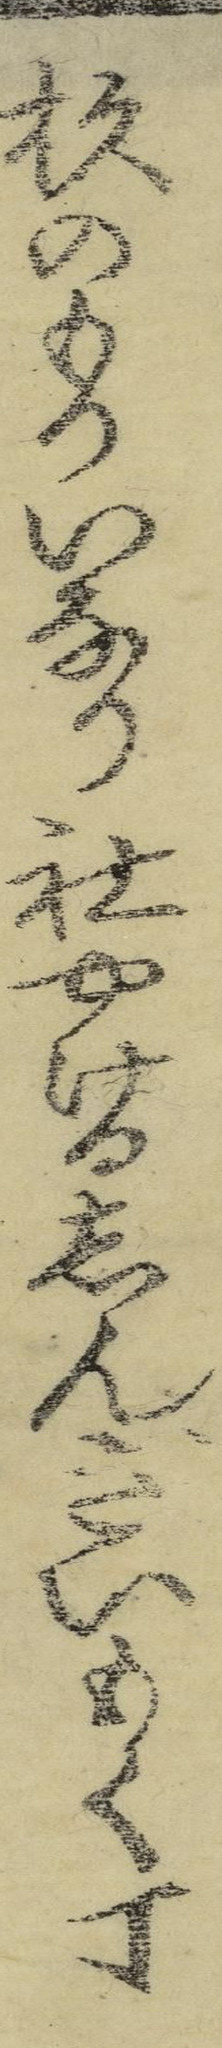杉のもりいなり社やけるしんさいもく丁
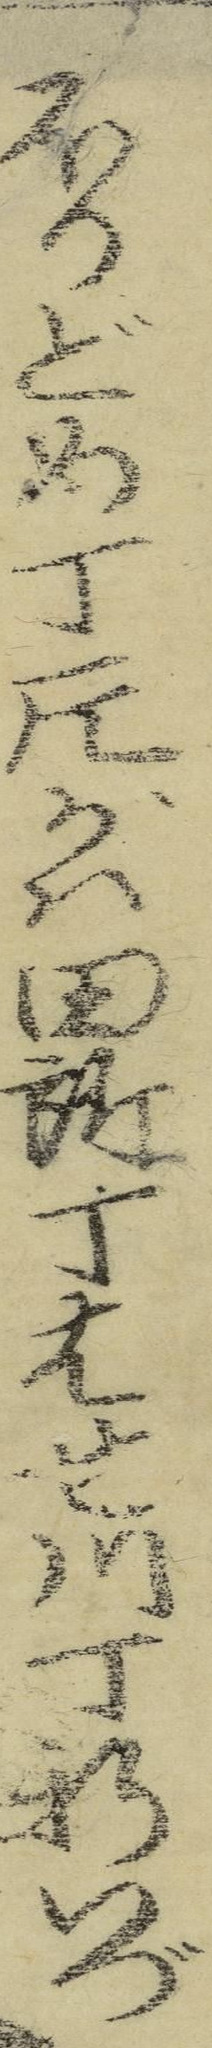ほりどめ丁片がは田所丁はせ川丁新いづ
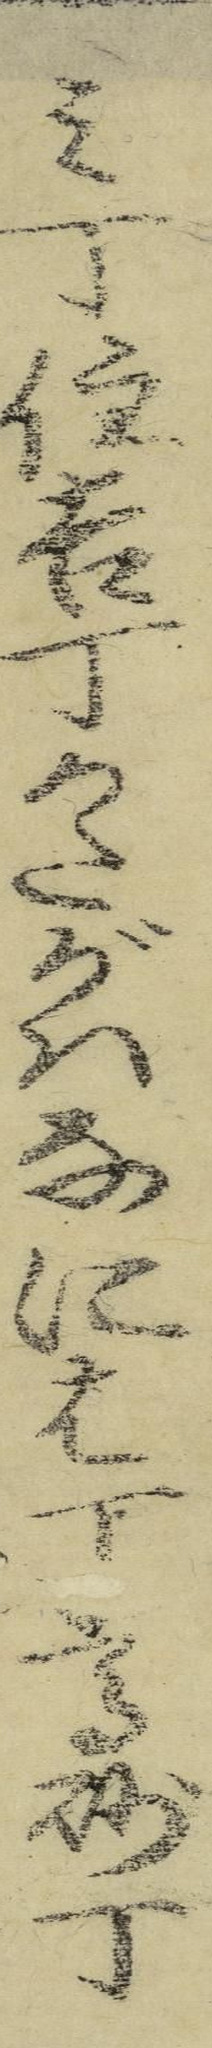み丁住吉丁かたがはなには丁高砂丁
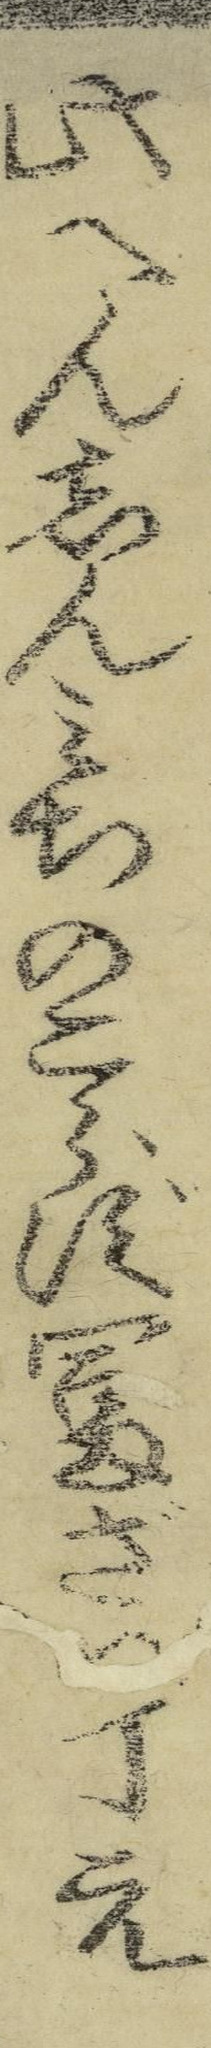此へんしんみちのこらず冨ざは丁元
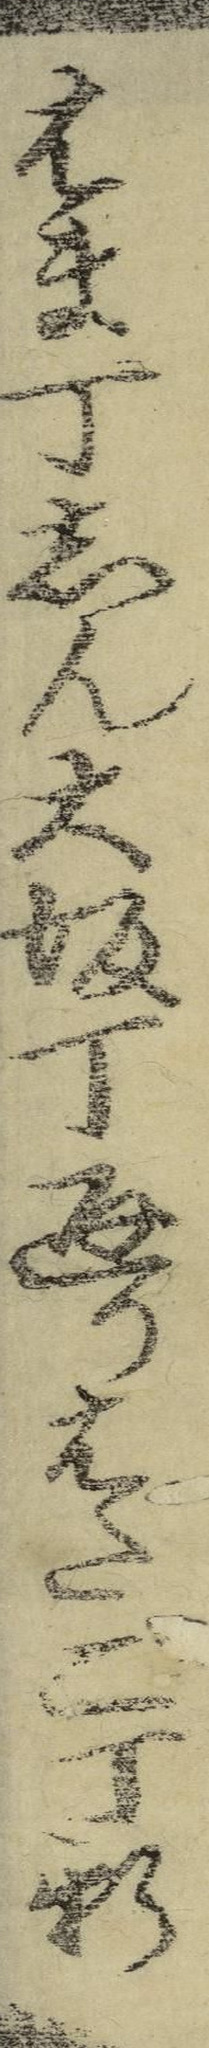えま丁しん大坂丁通りえたご丁新
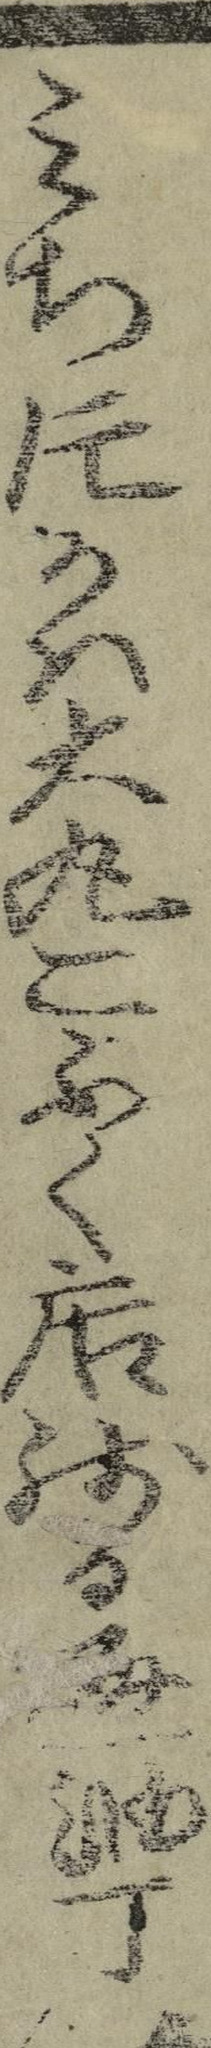みち片かは大丸こふく店残る通油丁
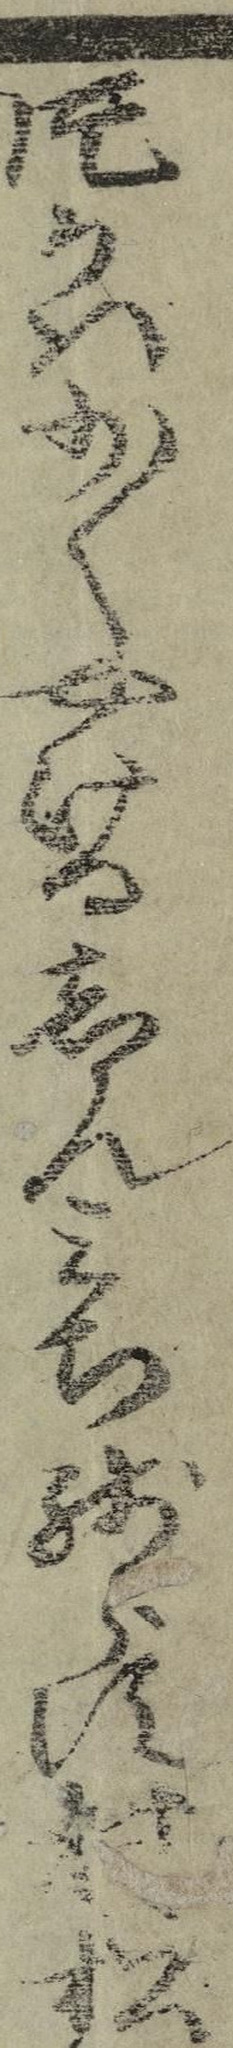片かは少々やけるしんみち残らず村松
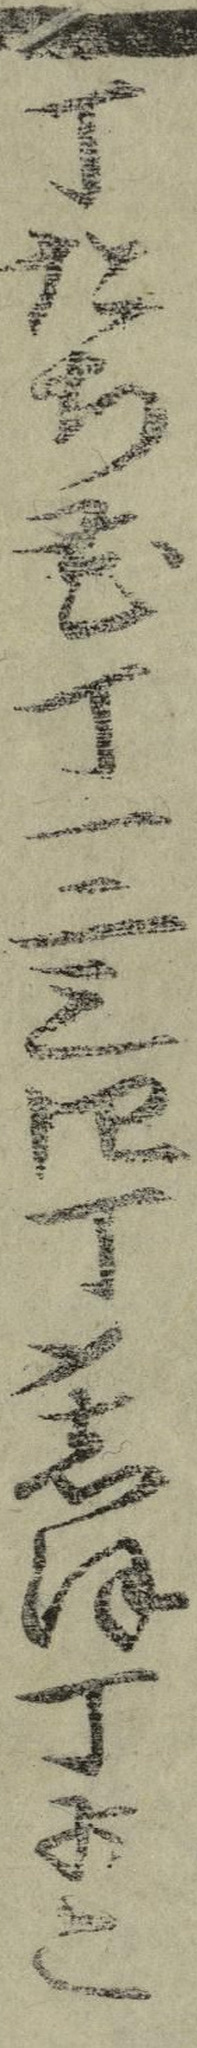丁たち花丁一二三四丁メしつ丁よこ
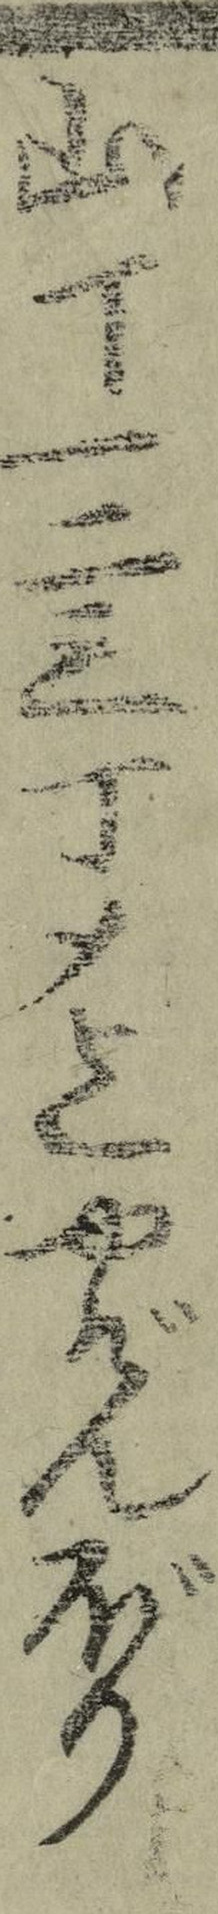山下一二三丁メ迄やげんぼり
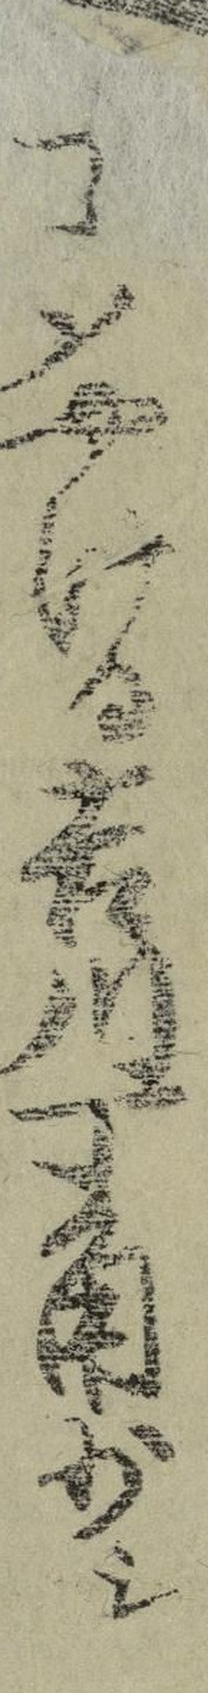丁メやける吉川丁角少シ
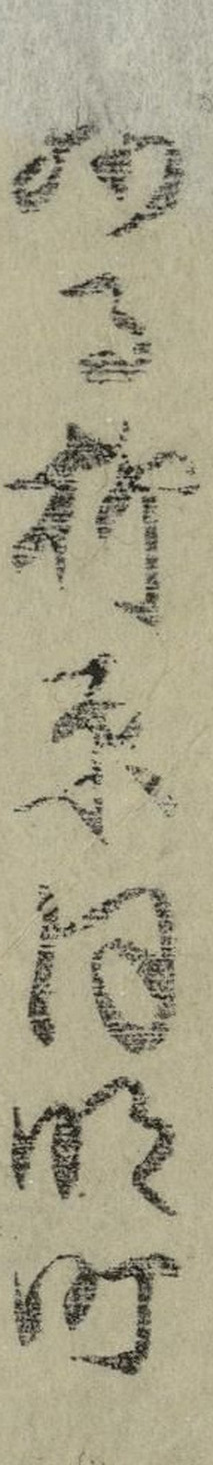残る柳原同明町
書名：[安政二年三月の江戸大火に関する瓦版]
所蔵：東京大学地震研究所図書室 Earthquake Research Institute Library, The University of Tokyo, JAPAN
